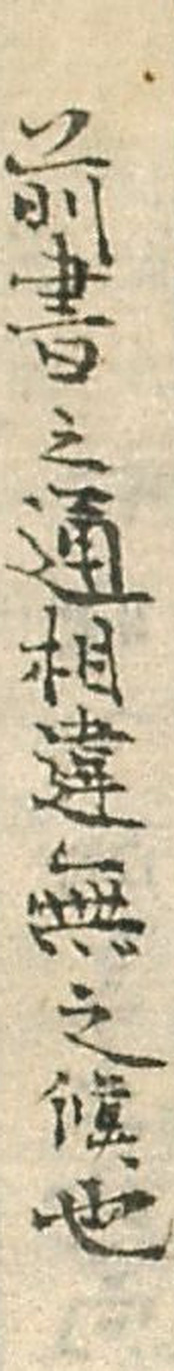前書之通相違無之候也
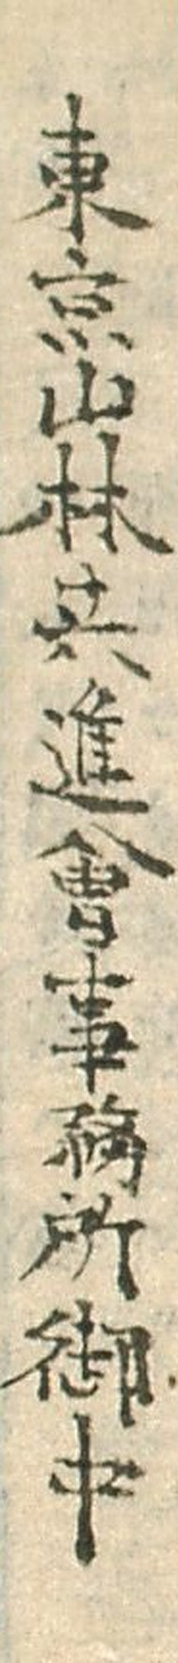東京山林共進会事務所御中

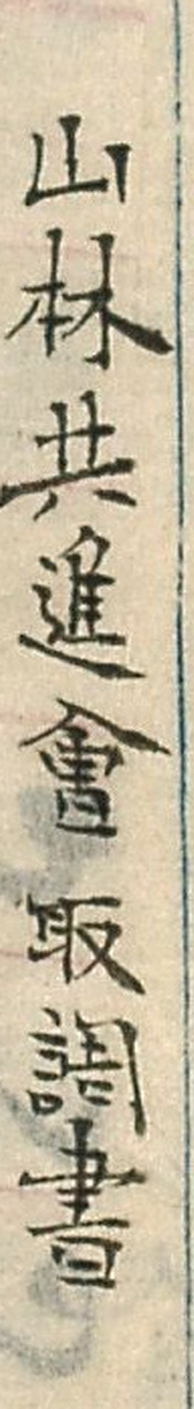山林共進会取調書
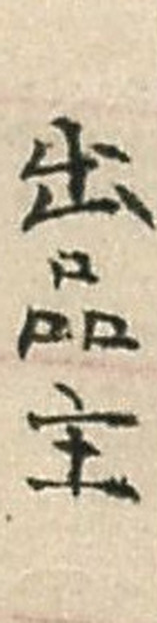出品主
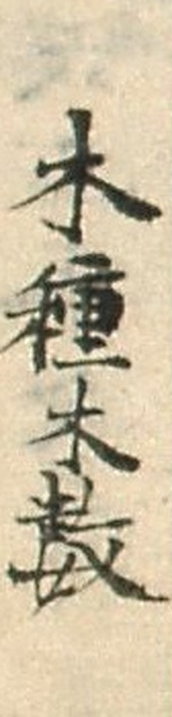木種木数

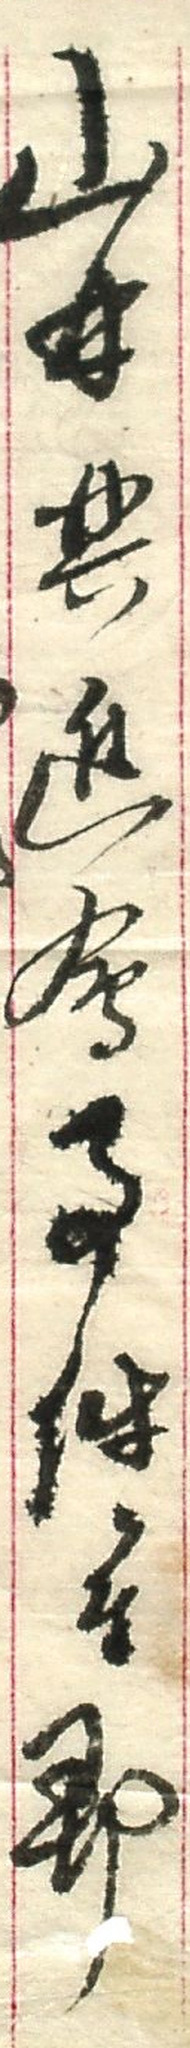山林共進会事件に付郡の
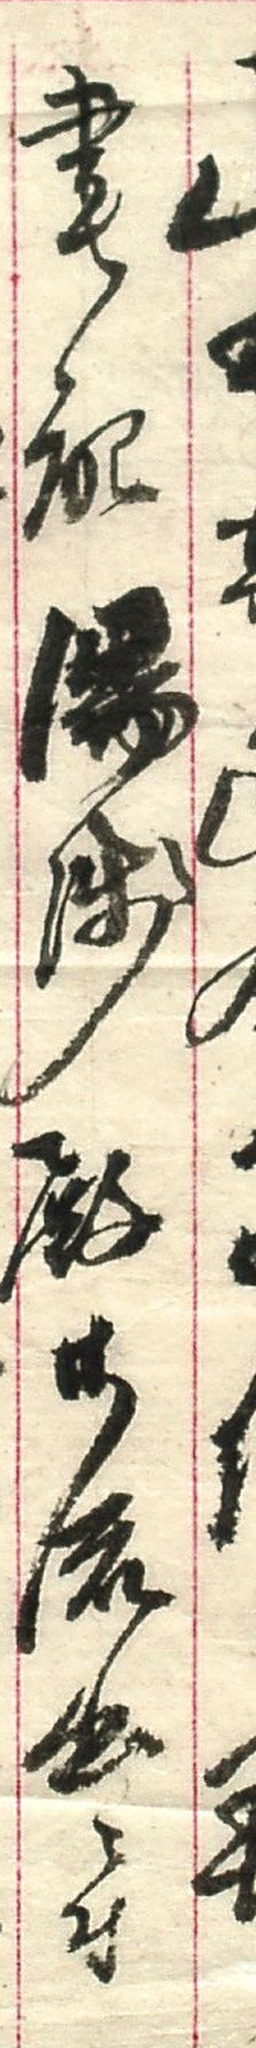書記湯浅殿御流出に付
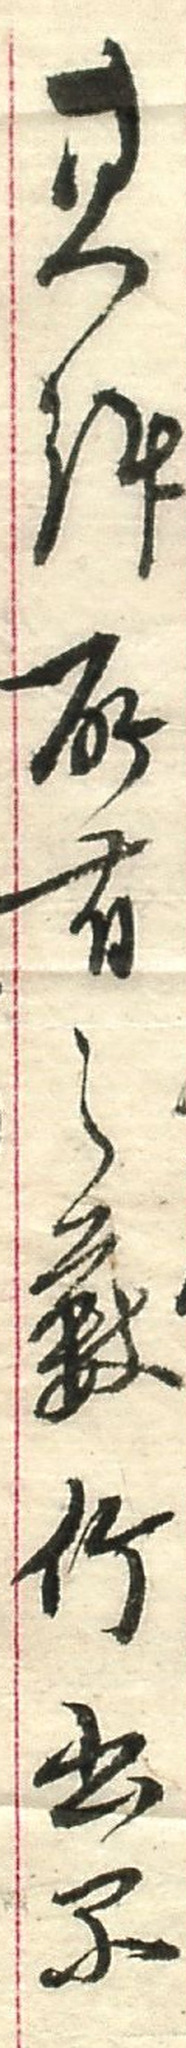其許所有之藪竹出品
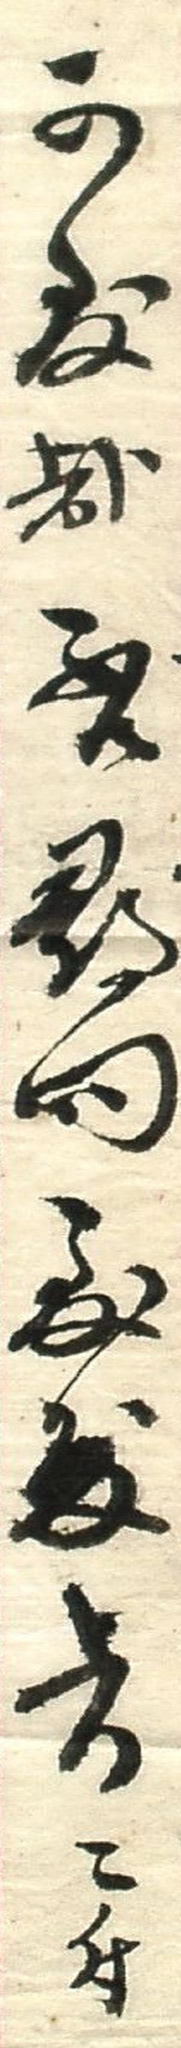可致哉否尋向致度旨に付
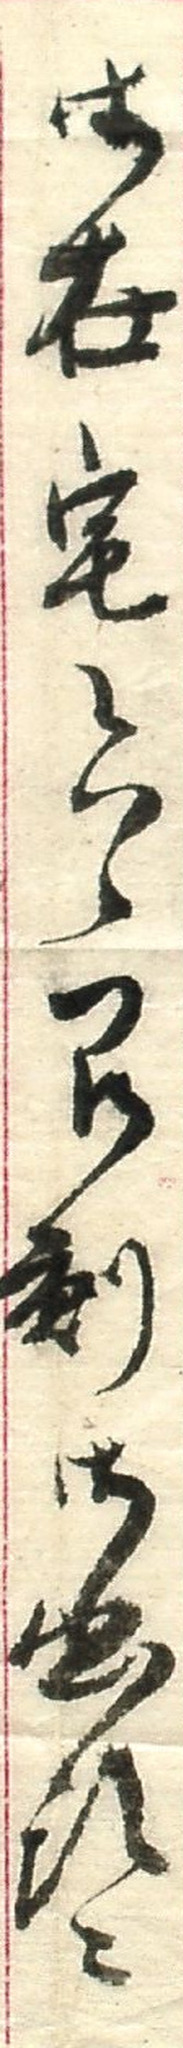御在宅候はゝ即刻御出頭被
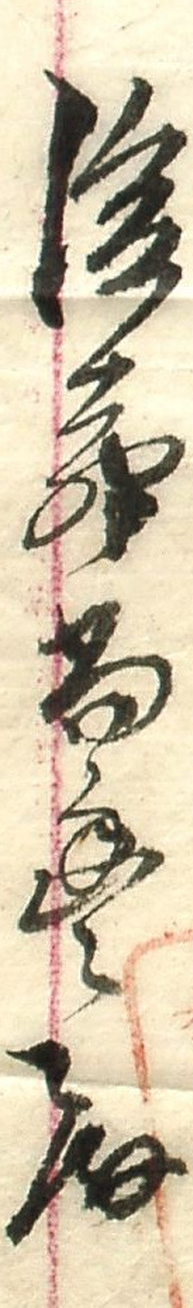後藤尚豊殿

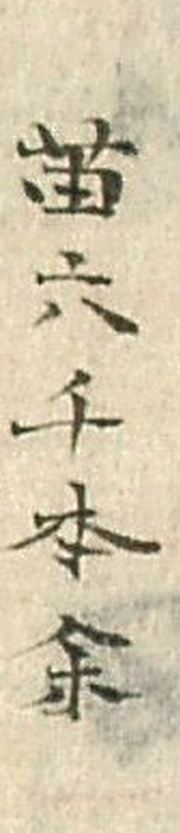苗六千本余
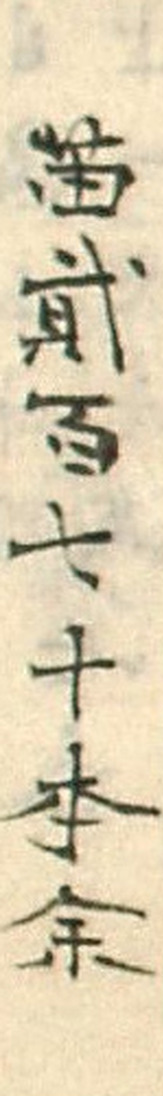苗弐百七十本余
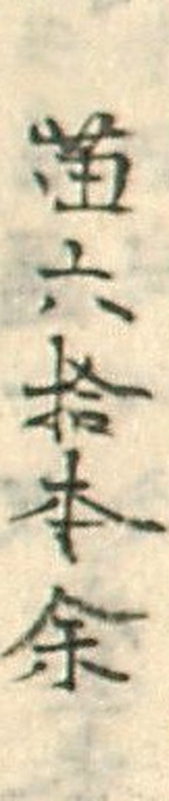苗六拾本余

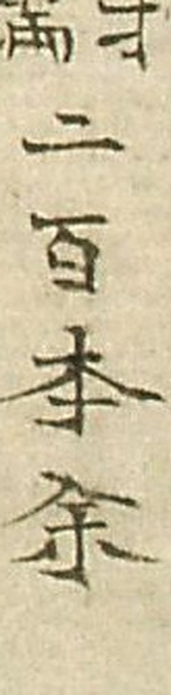苗百本余
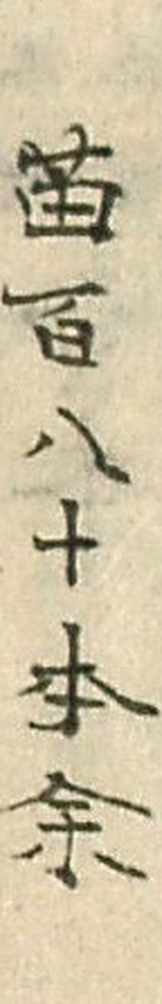苗百八十本余
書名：山林共進会取調書
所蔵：鳴門教育大学 Naruto University of Education
